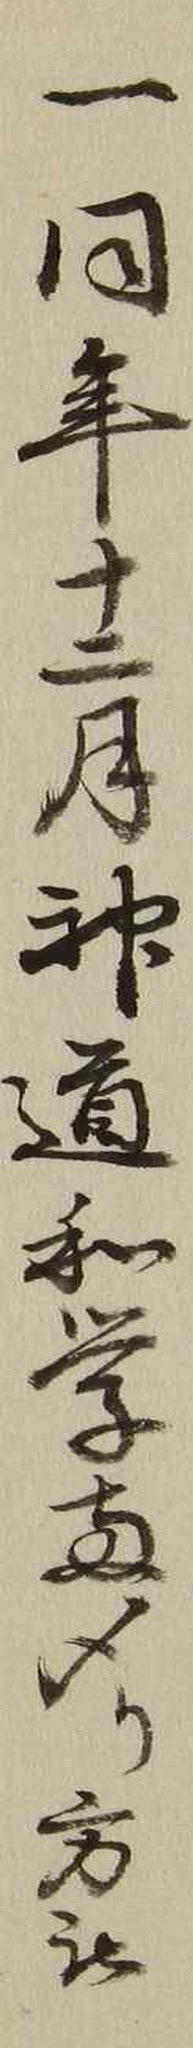一同年十二月神道和学両〆り方被
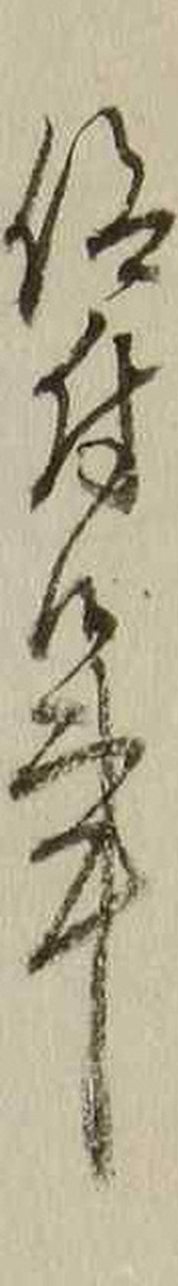仰付候事
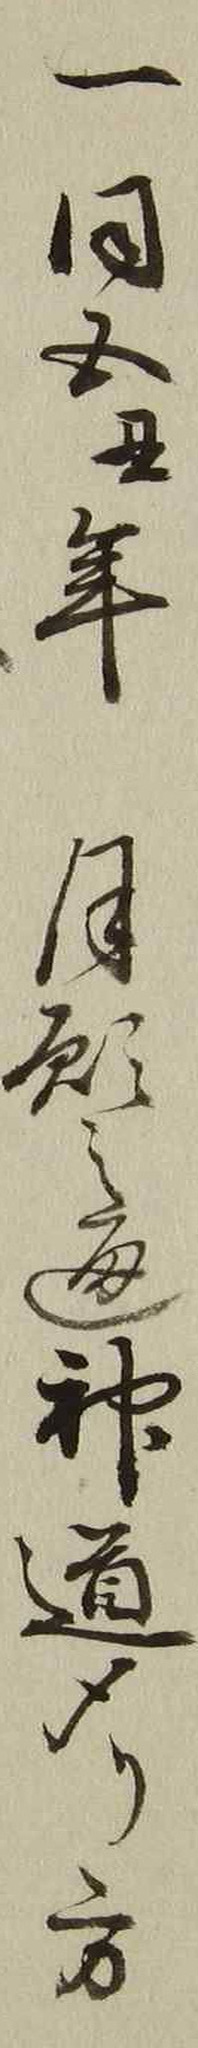一同五丑年月願之通神道〆り方
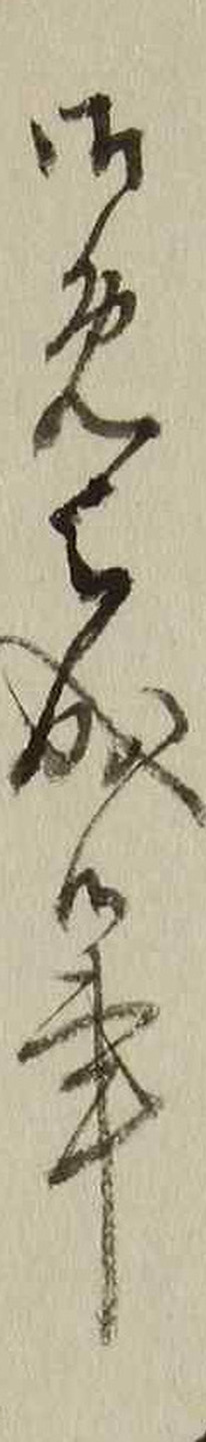御免被成候事
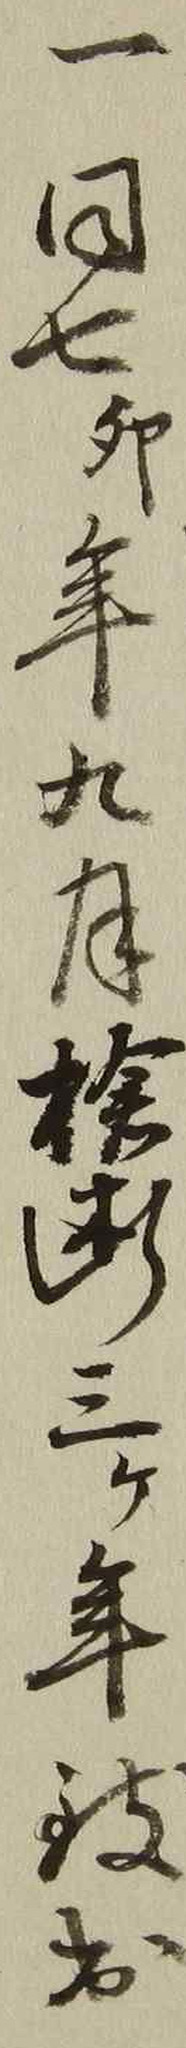一同七卯年九月槍術三ケ年致出
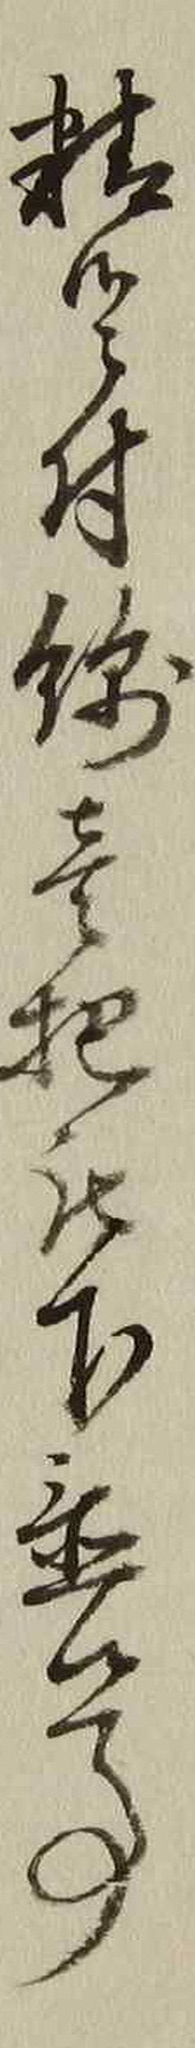精候ニ付綿壱把被下置候事
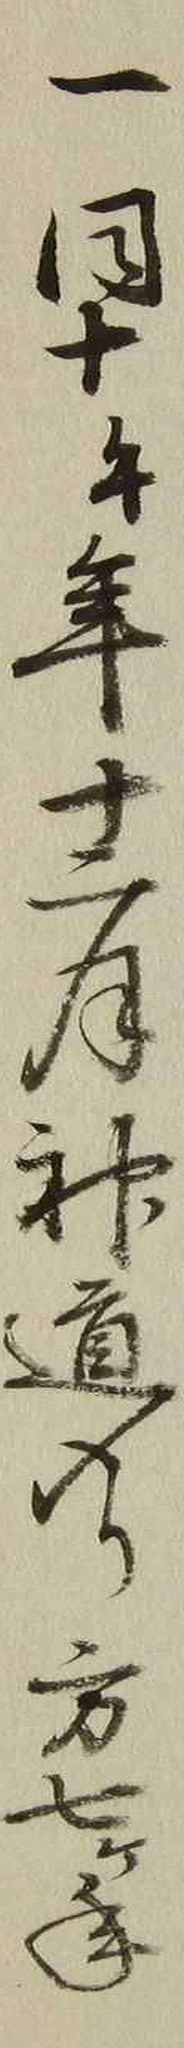一同十午年十二月神道〆り方七ケ年
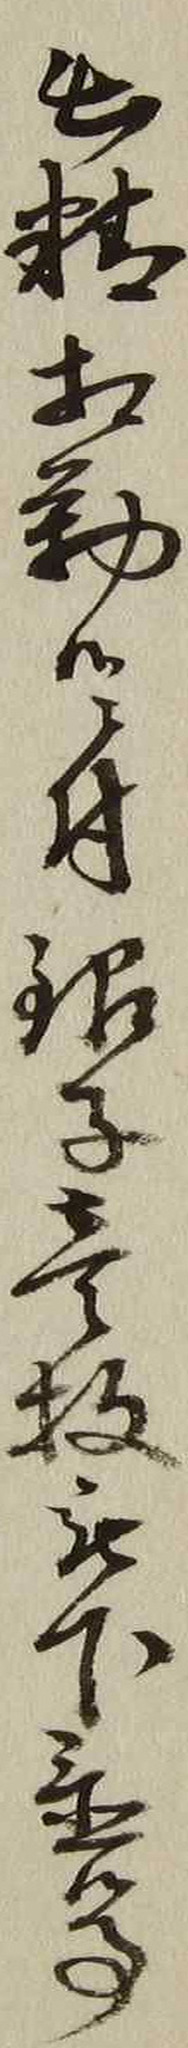出精相勤候ニ付銀子壱枚被下置候等
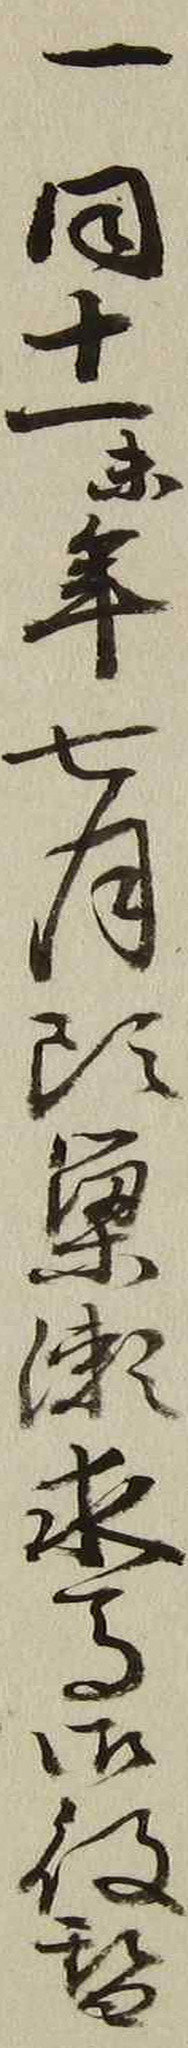一同十一未年七月頭簗瀬求馬御役替
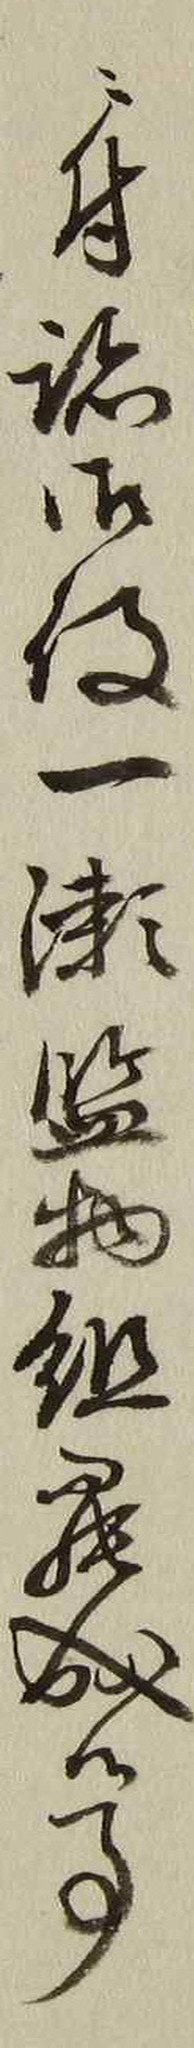ニ付跡御役一瀬監物組罷成候事
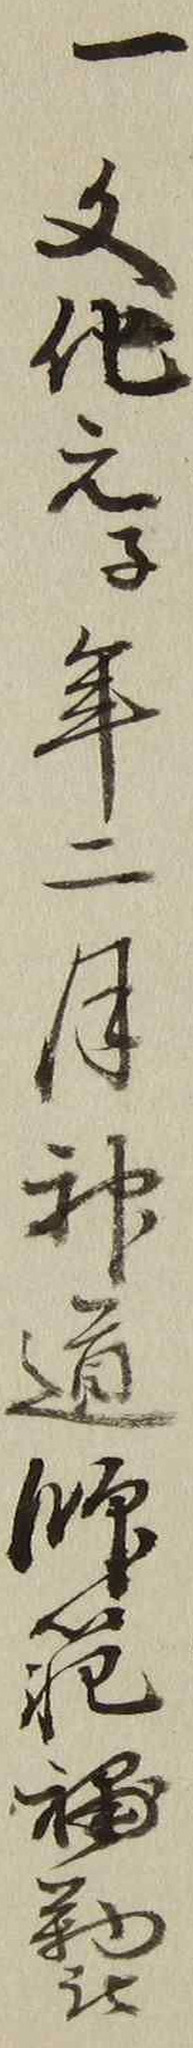一文化元子年二月神道師範補勤被
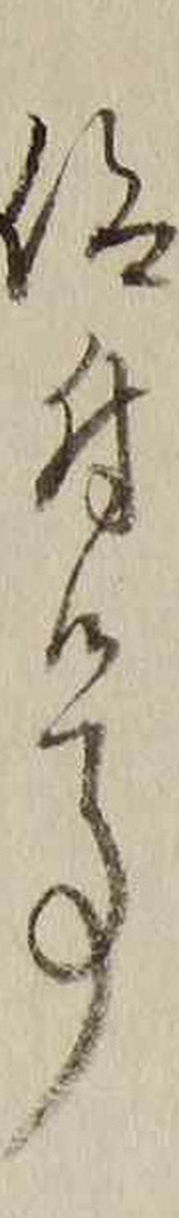仰付候事
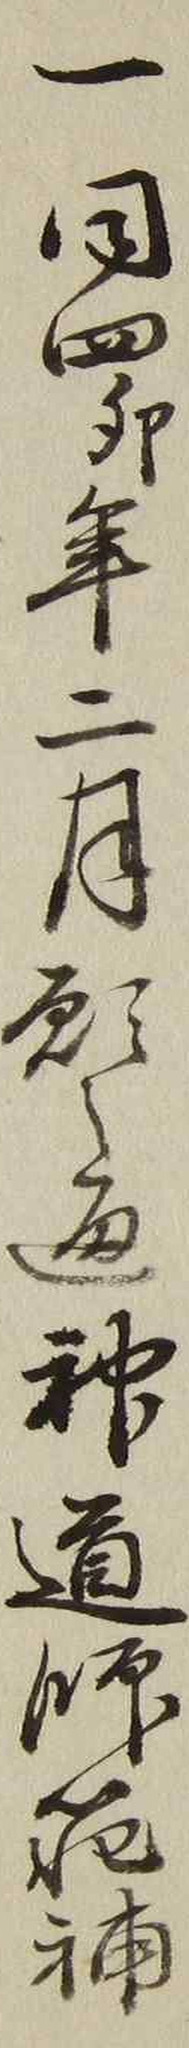一同四卯年二月願之通神道師範補
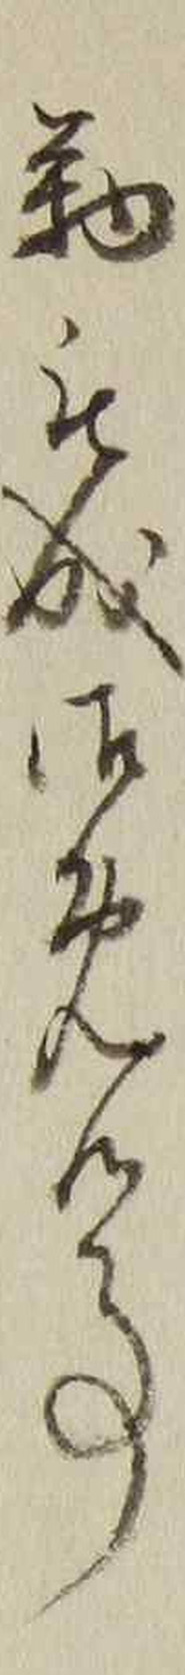勤被成御免候事
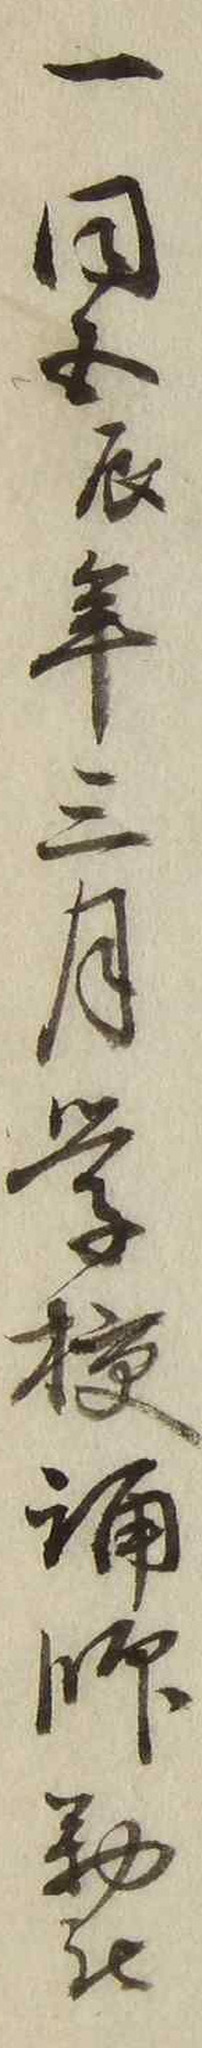一同五辰年三月学校誦師勤被

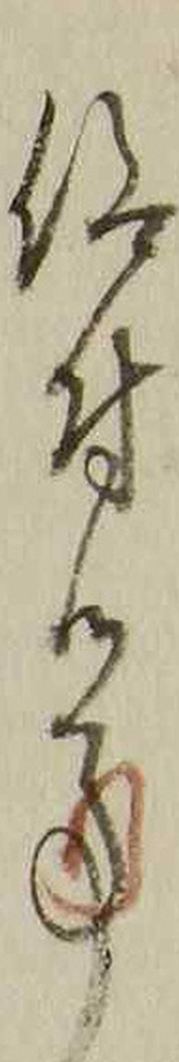仰付候事
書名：諸士系譜　巻之35　は之部3
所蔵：会津若松市立会津図書館
